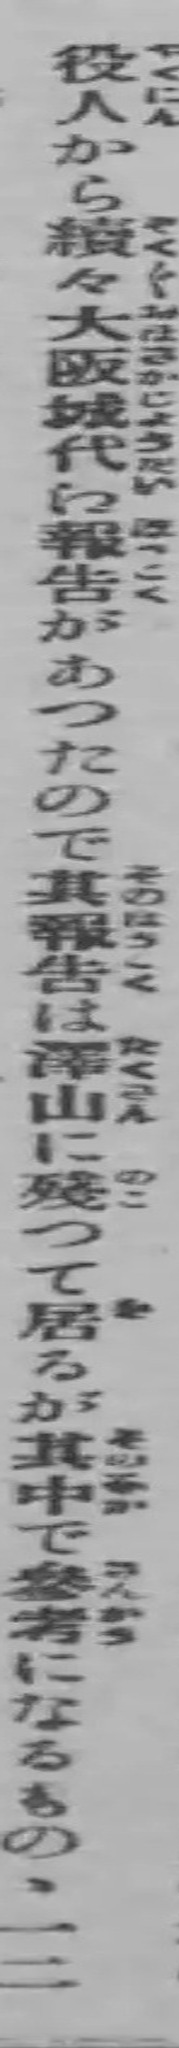役人から続々大阪城代え報告があつたので其報告は沢山に残つて居るが其中で参考になるものゝ一二
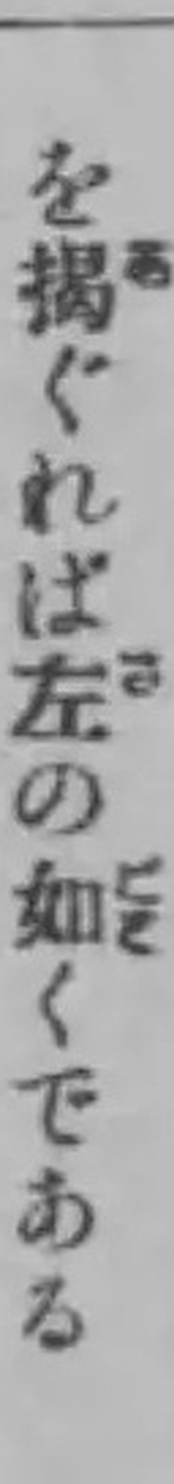を揚ぐれば左の如くである
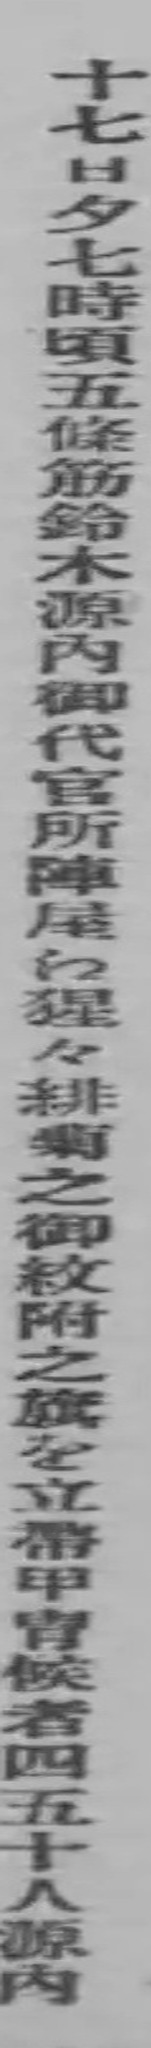十七日夕七時頃五條筋鈴木源内御代官所陣屋え猩々緋菊之御紋附之旗を立帯甲冑候者四五十人源内
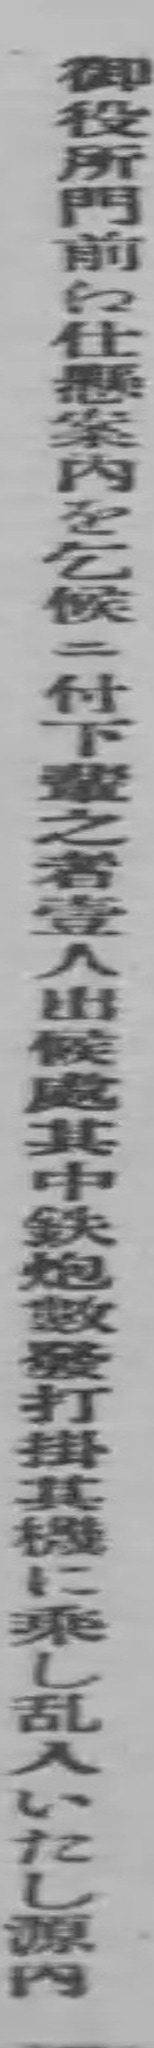御役所門前え仕懸案内を乞候ニ付下輩之者壱人出候処其中鉄炮数発打掛其機に乗し乱入いたし源内
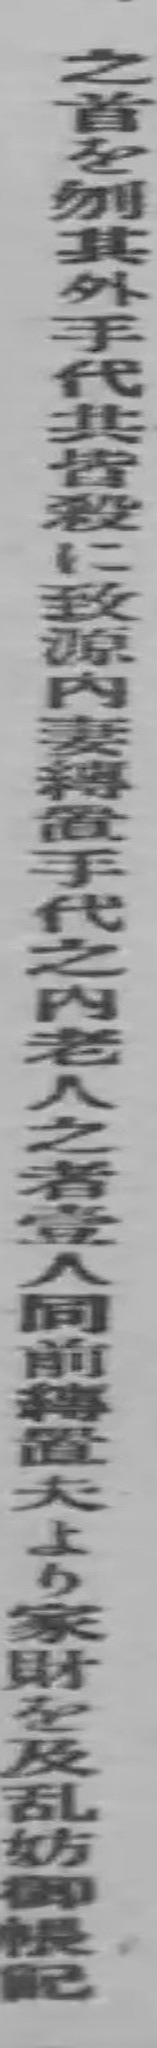之首を刎其外手代共皆殺に致源内妻縛置手代之内老人之者壱人同前縛置夫より家財を及乱妨御帳記
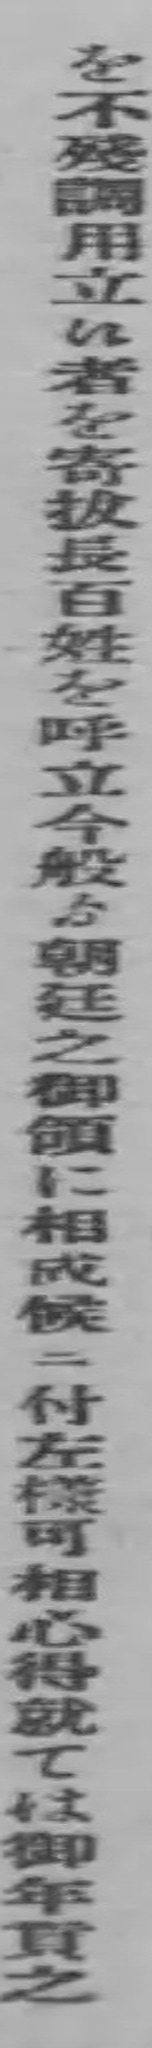を不残調用立候者を寄抜長百姓を呼立今般ゟ朝廷之御領に相成候ニ付左様可相心得就ては御年貢之
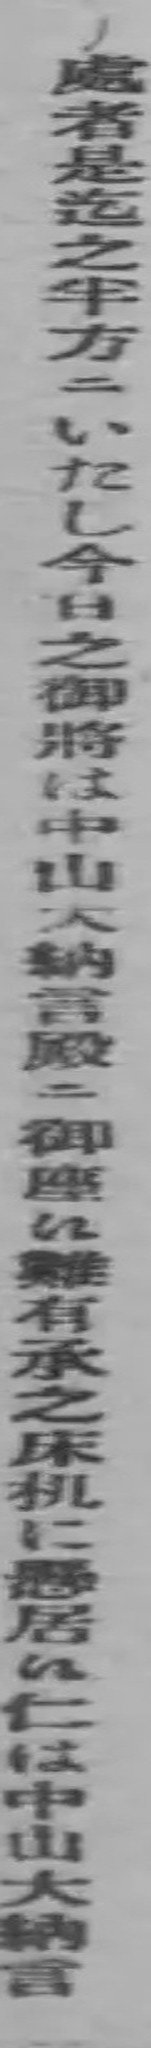処者是迄之半方ニいたし今日之御将は中山大納言殿ニ御座候難有承之床机に懸居候仁は中山大納言

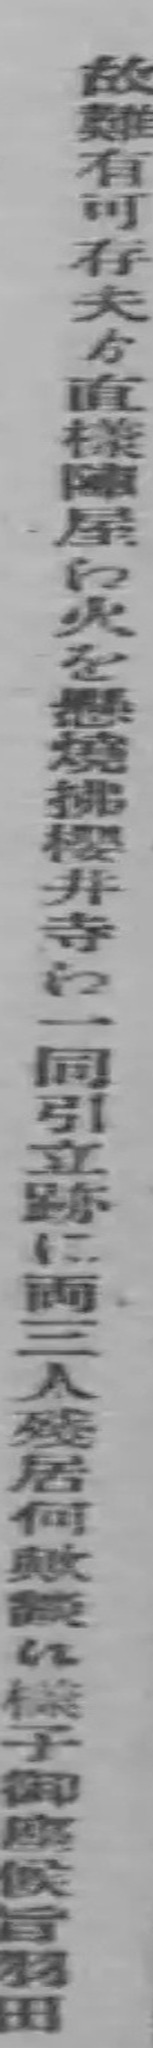故難有可存夫ゟ直様陣屋え火を懸焼払桜井寺え一同引立跡に両三人残居何歟談候様子御座候旨羽田
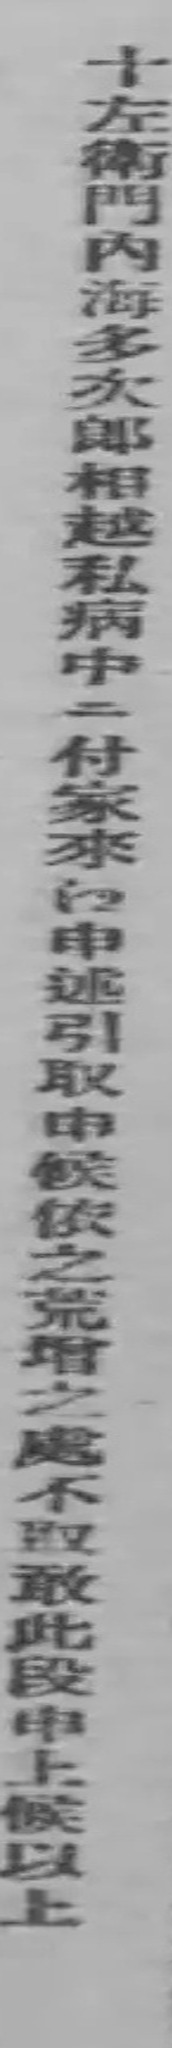十左衛門内海多次郎相越私病中ニ付家来え申述引取申候依之荒増之処不取敢此段申上候以上
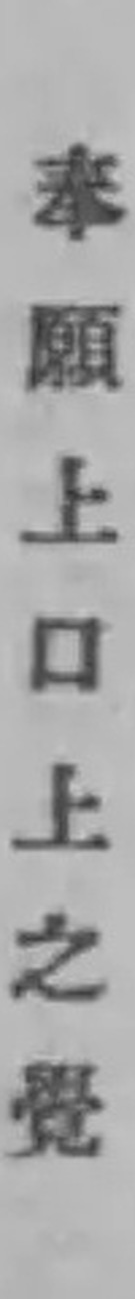奉願口上之覚
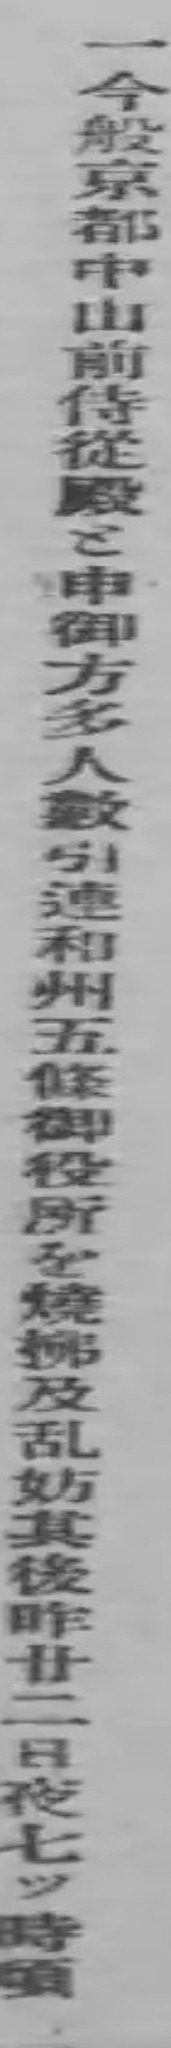一今般京都中山前侍従殿と申御方多人数引連和州五條御役所を焼払及乱妨其後昨廿二日夜七ツ時頃
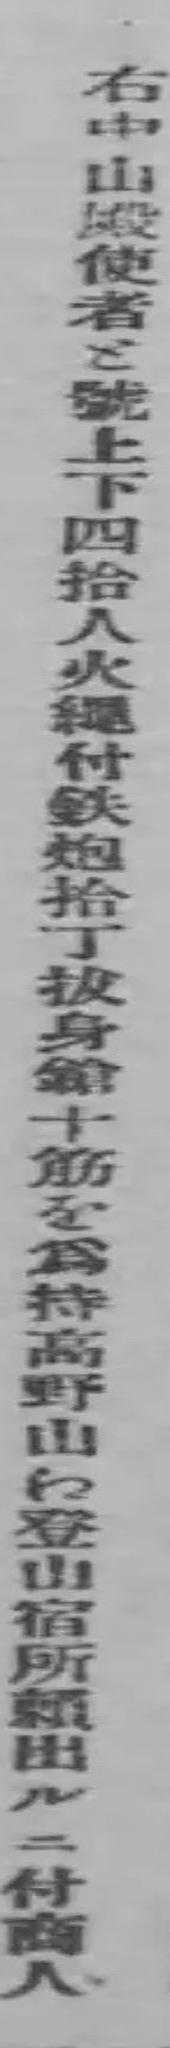右中山殿使者と号上下四拾人火縄付鉄炮拾丁抜身鎗十筋を為持高野山え登山宿所頼出ルニ付商人
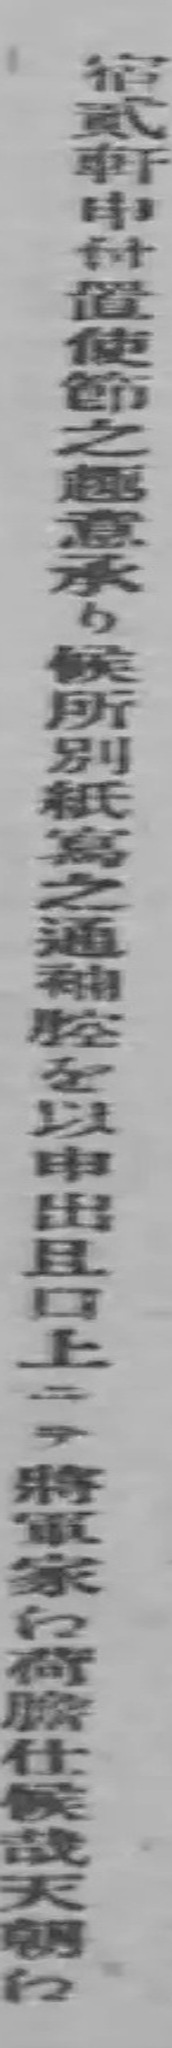宿弐軒申付置使節之趣意承り候所別紙写之通袖腔を以申出且口上ニテ将軍家え荷膽仕候哉天朝え
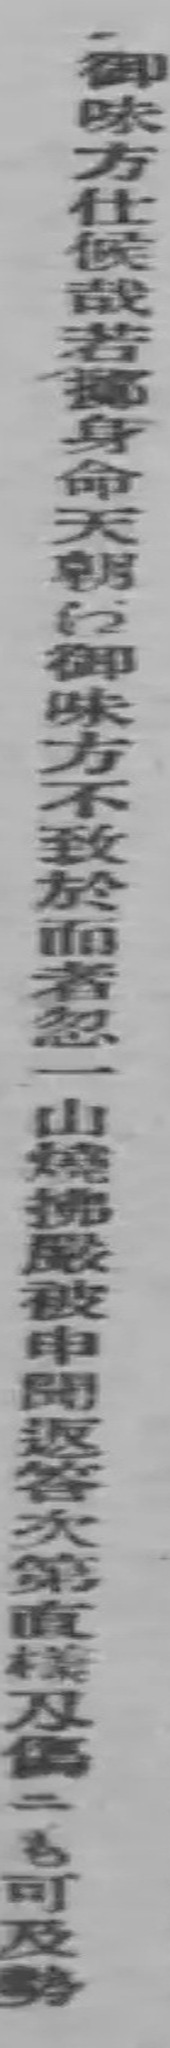御味方仕候哉若揶身命天朝え御味方不致於而者忽一山焼払厳被申聞返答次第直様刃傷ニも可及勢
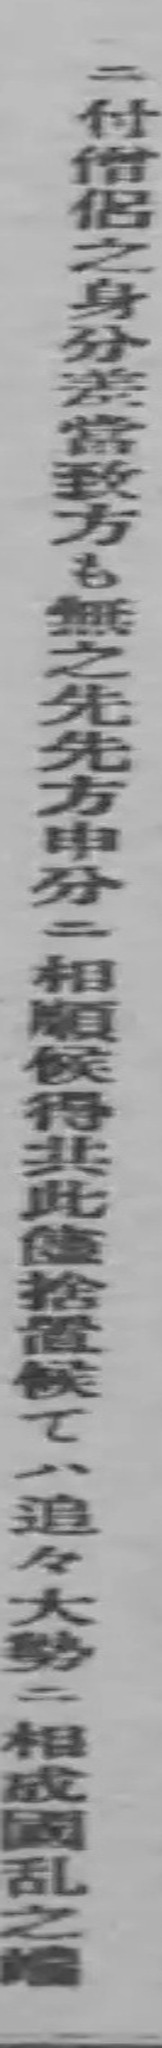ニ付僧侶之身分差当致方も無之先先方申分ニ相順候得共此侭捨置候てハ追々大勢ニ相成固乱之端
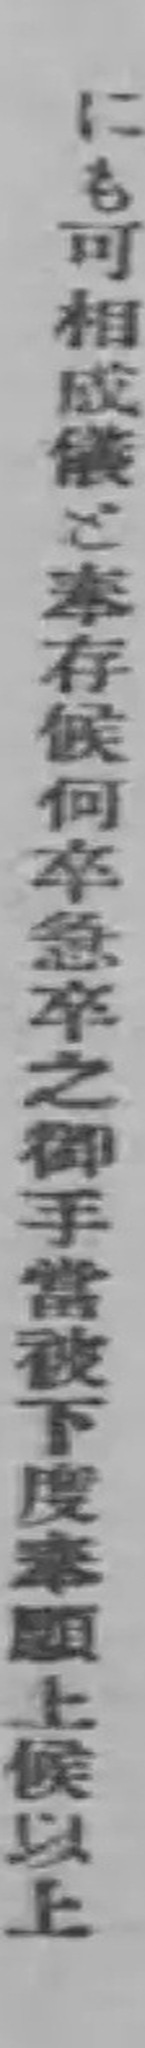にも可相成儀と奉存候何卒急卒之御手当被下度奉願上候以上
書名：豊橋市史談
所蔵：国立国会図書館 National Diet Library, JAPAN
